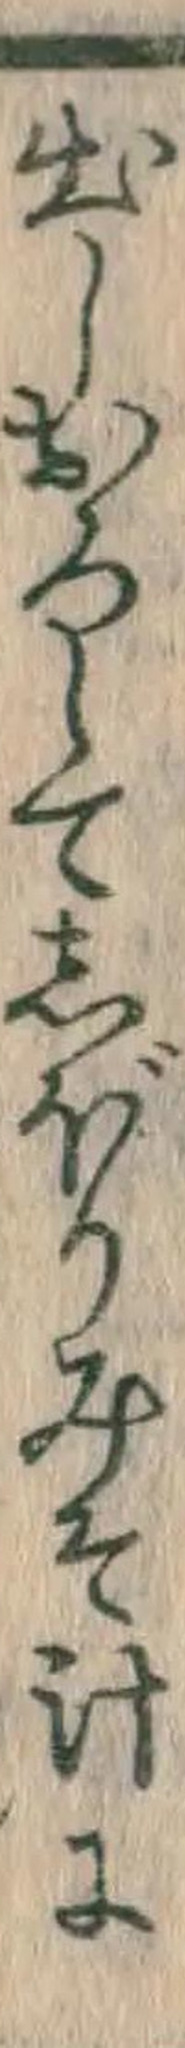出しおろしてしぼりみそ汁に
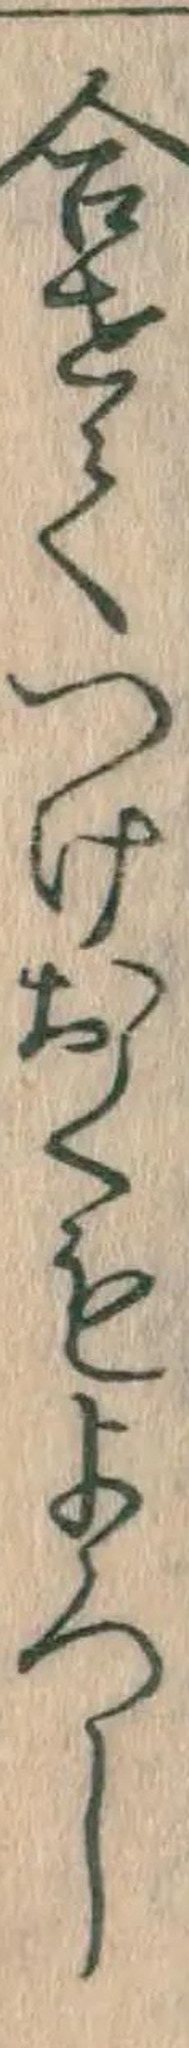合せてつけおくもよろし
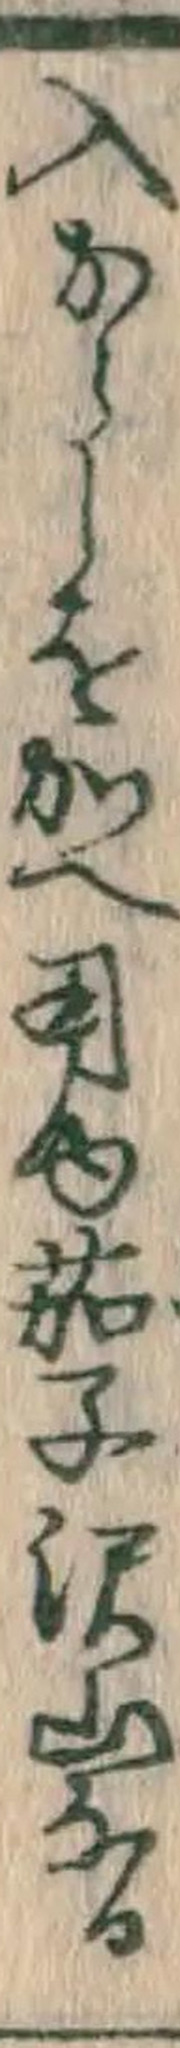入からしを加へ用ゆ茄子沢山なる
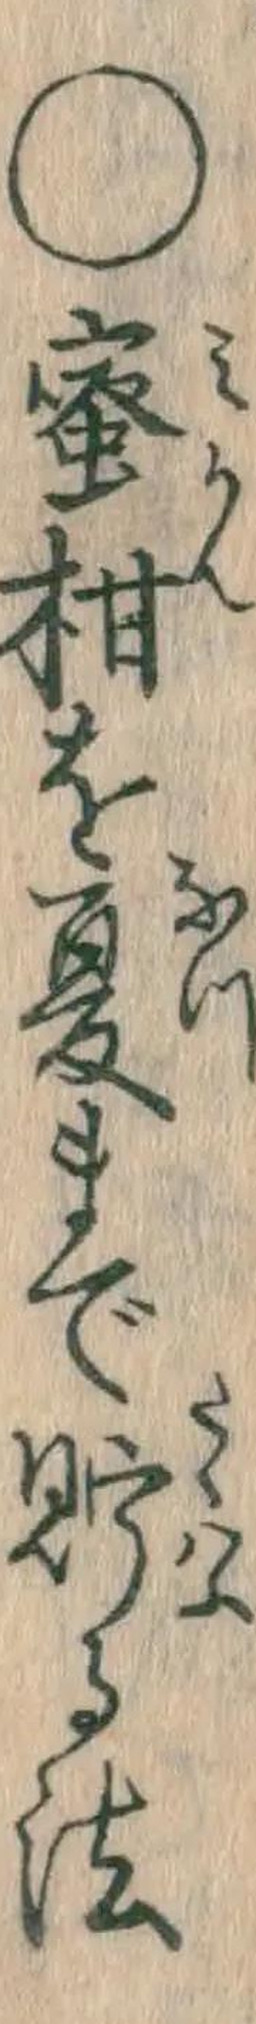○蜜柑を夏まで貯る法
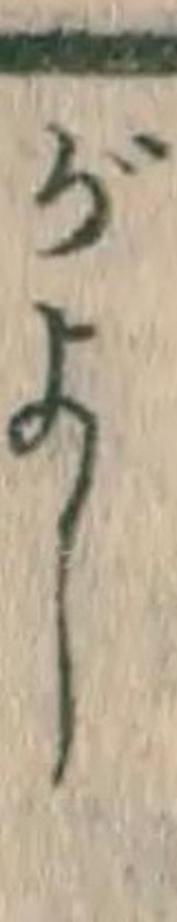がよし
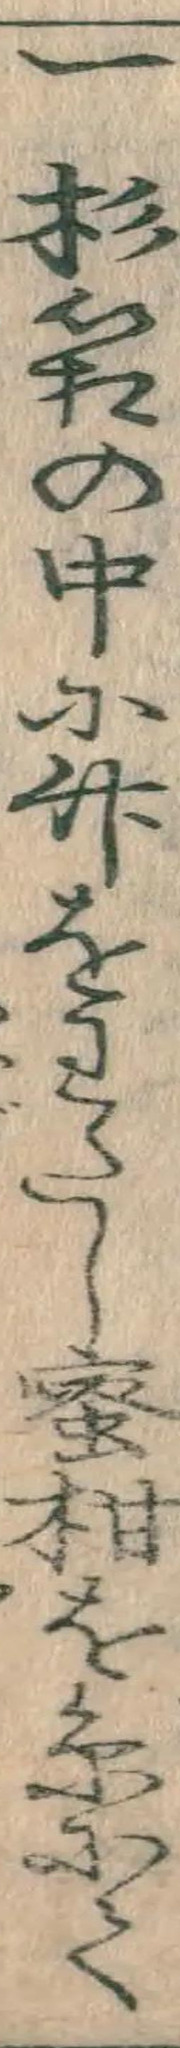一杉箱の中に竹をわたし蜜柑を糸にて
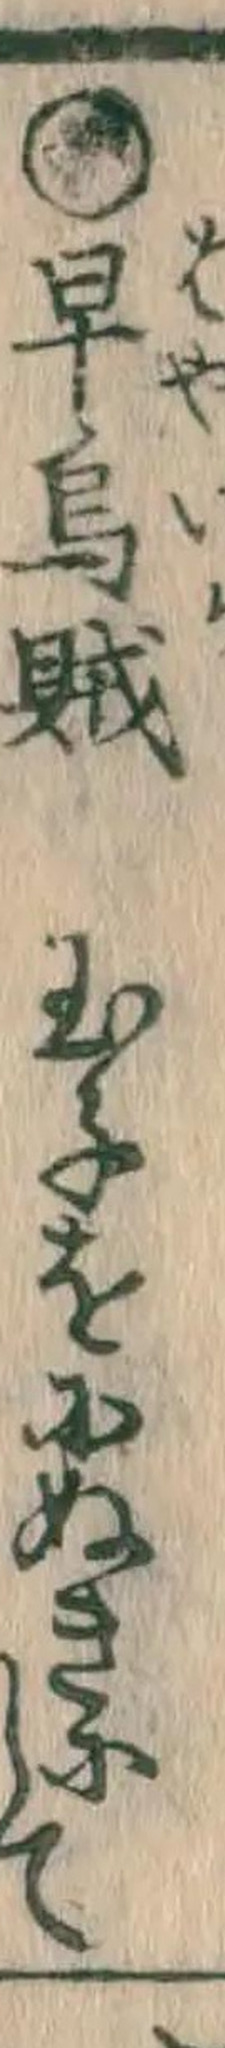○早烏賊玉子をにぬきにして
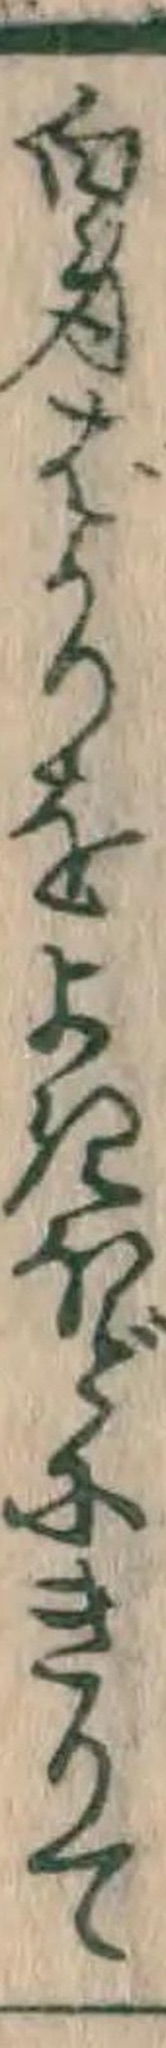白身ばかりをよきほどにきりて
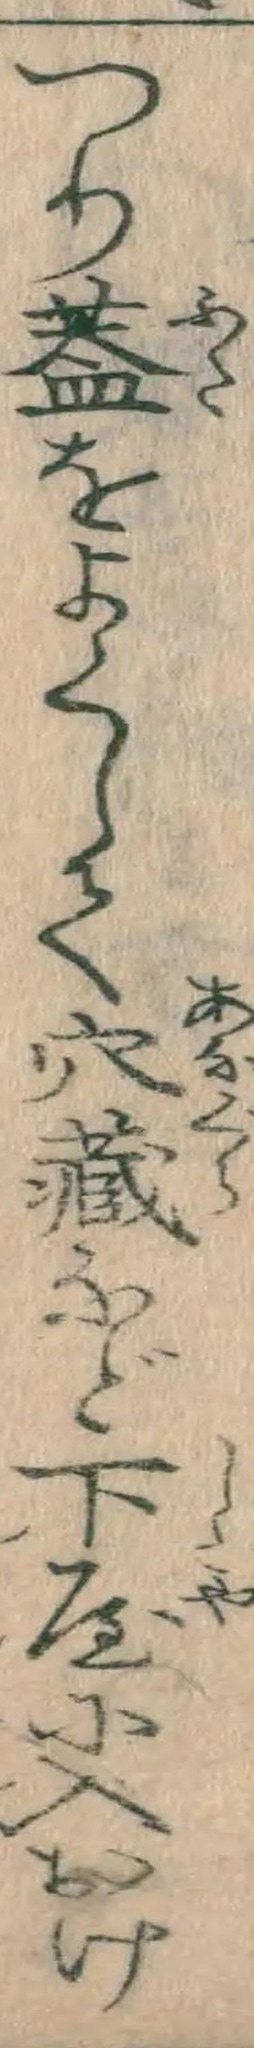つり蓋をよくして穴蔵など下屋に入おけ
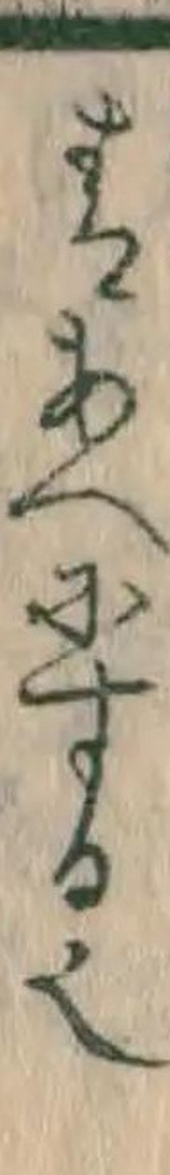青あへにする也
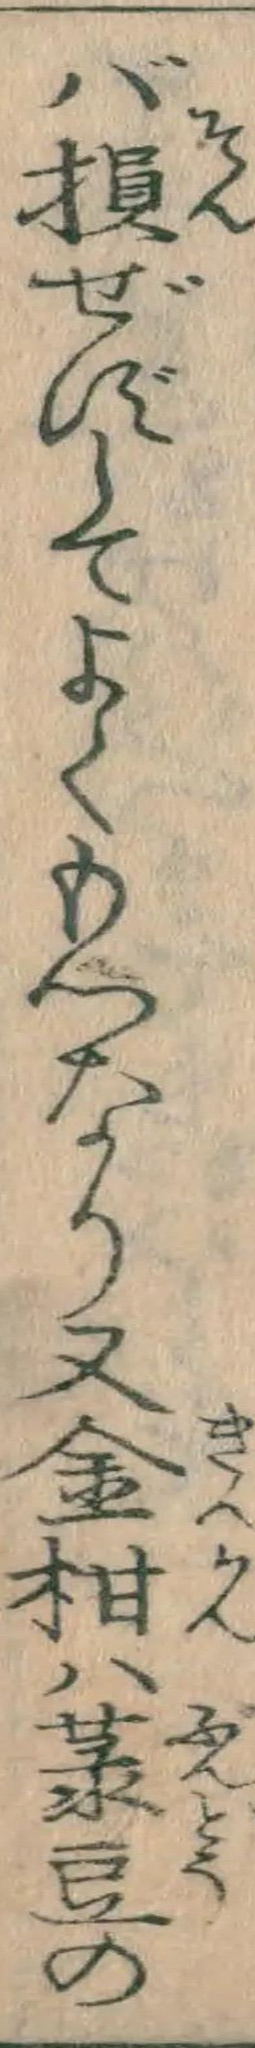ば損ぜずしてよくもつなり又金柑は菉豆の

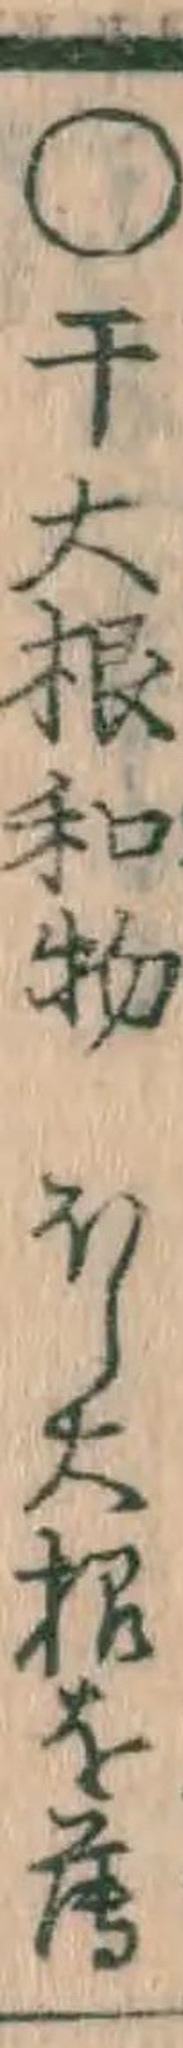○干大根和物ほし大根を薄
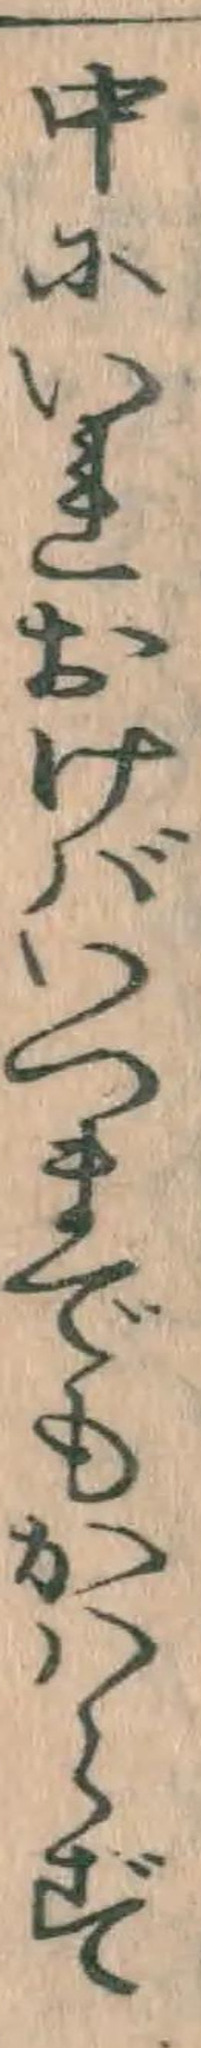中にいれおけばいつまでもかはらず
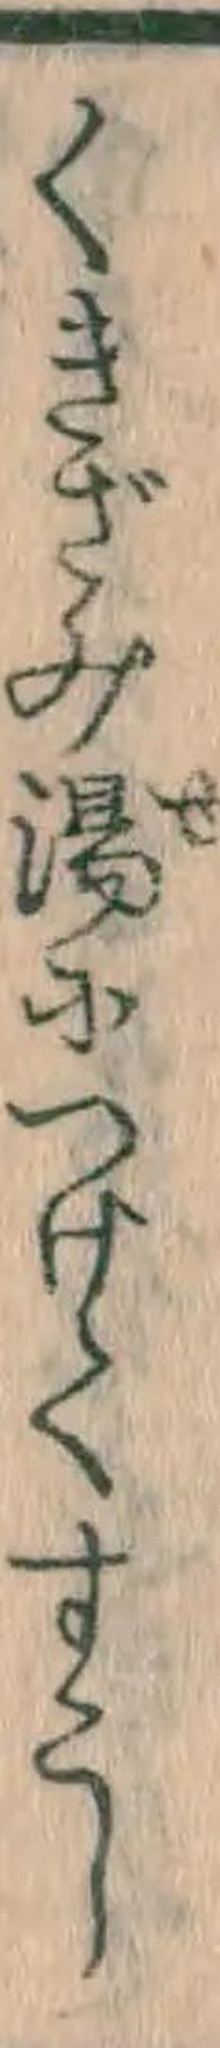くきざみ湯につけてすこし
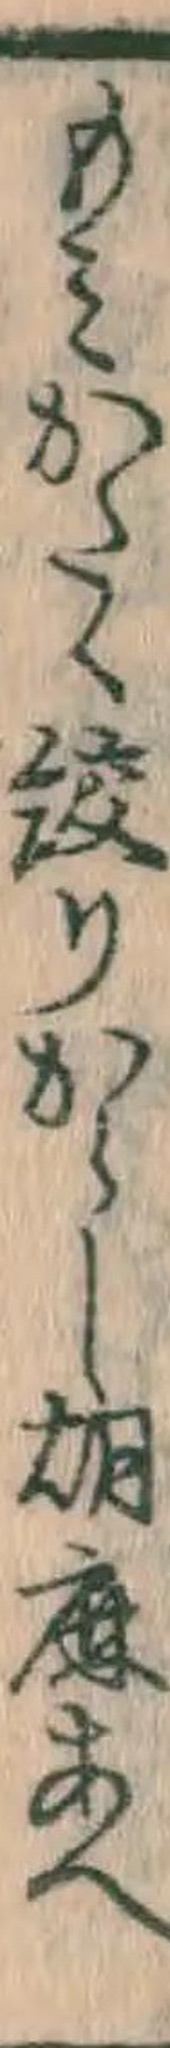もみかたく絞りからし胡麻あへ
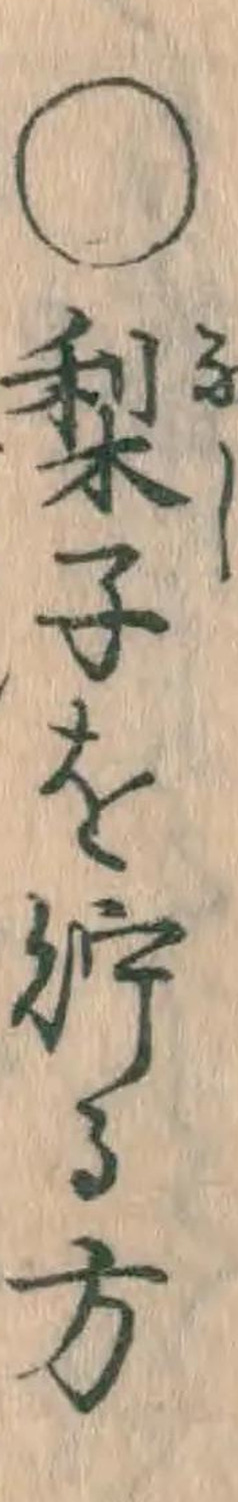○梨子を貯る方
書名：広益秘事大全 3巻. [5]
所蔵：国立国会図書館 National Diet Library, JAPAN
